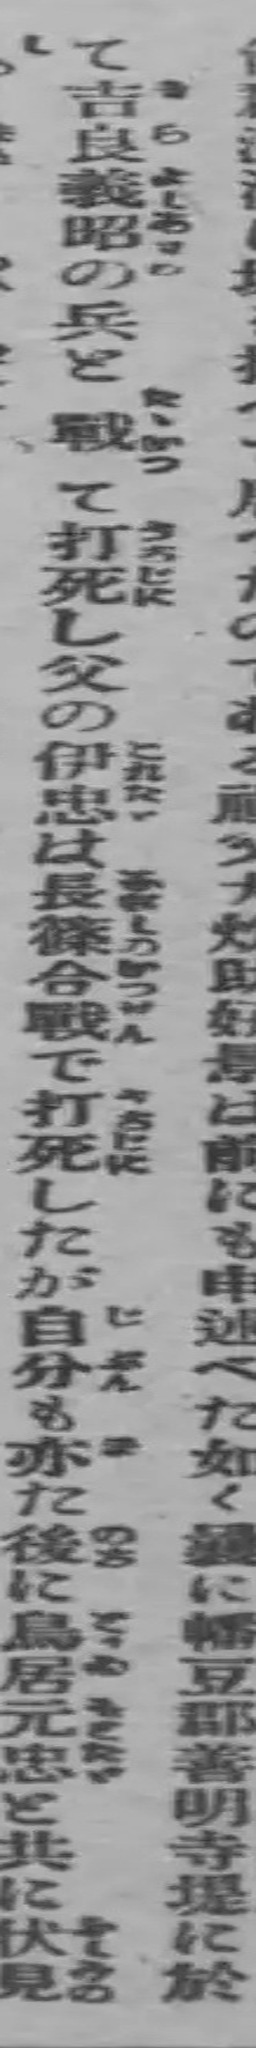て吉良義昭の兵と戦て打死し父の伊忠は長篠合戦で打死したが自分も亦た後に鳥居元忠と共に伏見
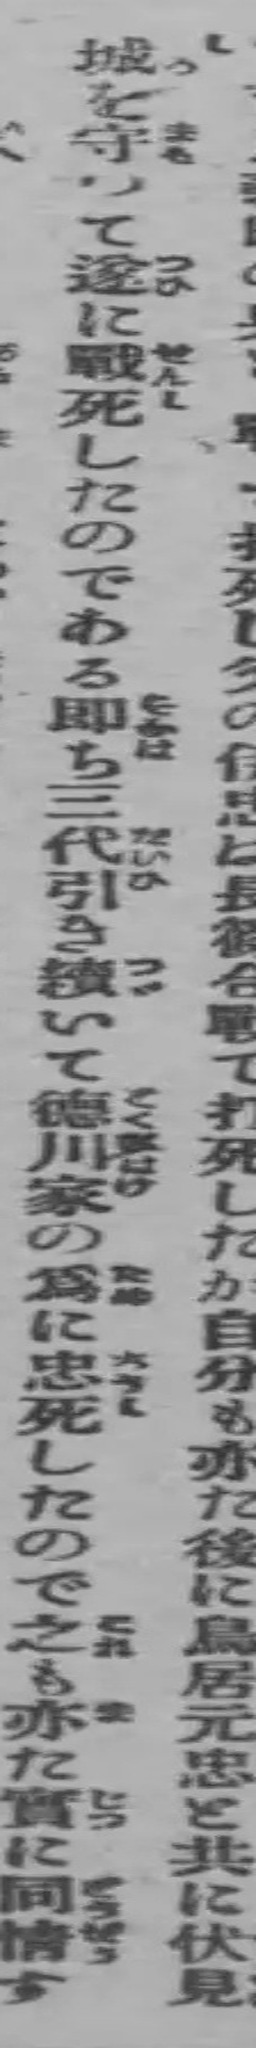城を守つて遂に戦死したのである即ち三代引き続いて徳川家の為に忠死したので之も亦た実に同情す
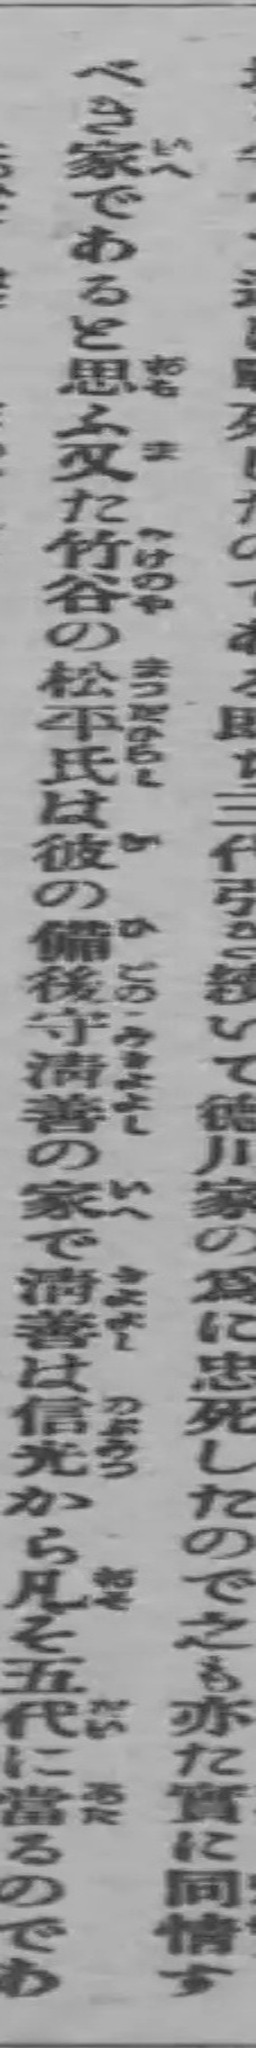べき家であると思ふ又た竹谷の松平氏は彼の肥後守清善の家で清善は信光から凡そ五代に当るのであ
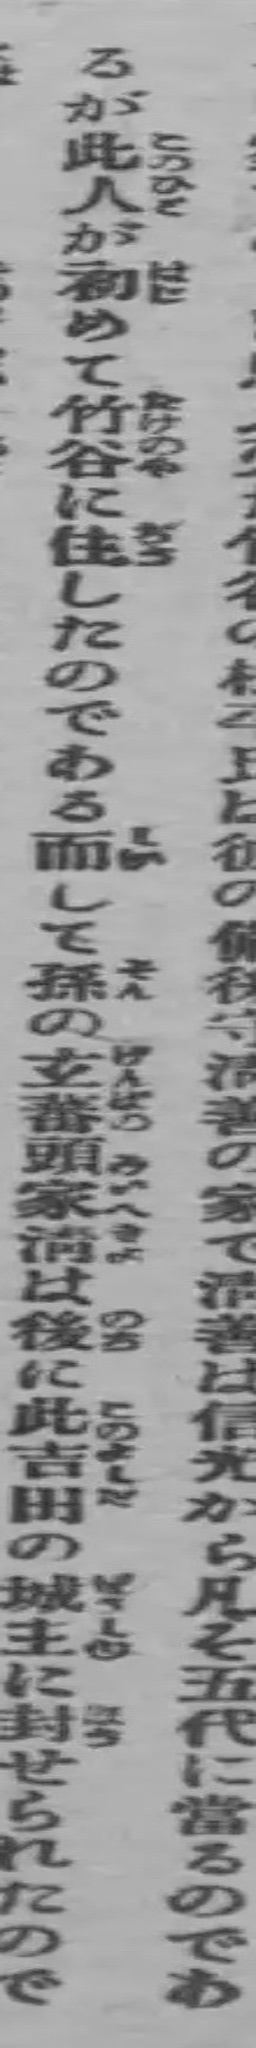るが此人が初めて竹谷に住したのである而して孫の玄蕃頭家清は後に此吉田の城主に封せられたので
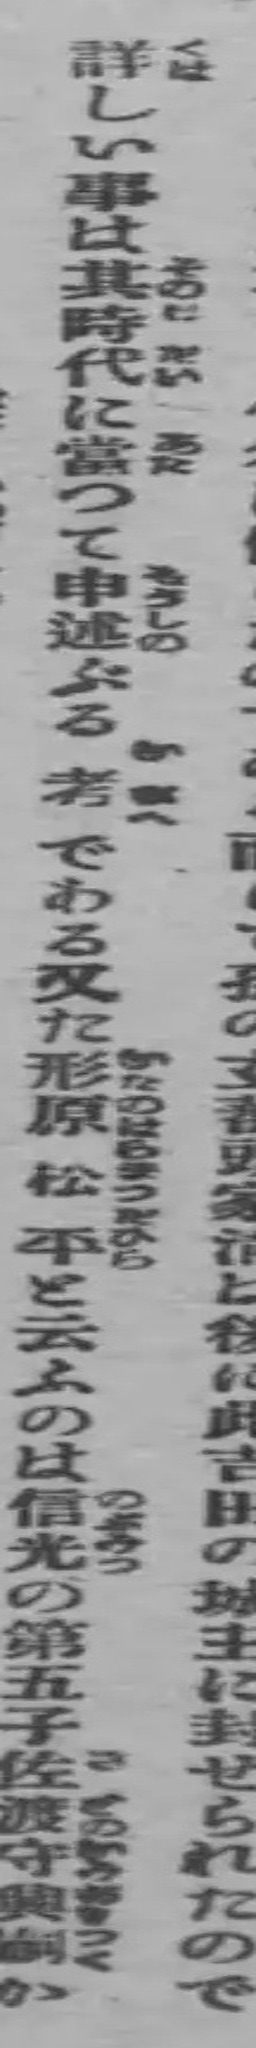詳しい事は其時代に当つて申述ぶる考である又た形原松平と云ふのはの信光の第五子佐渡守興嗣か
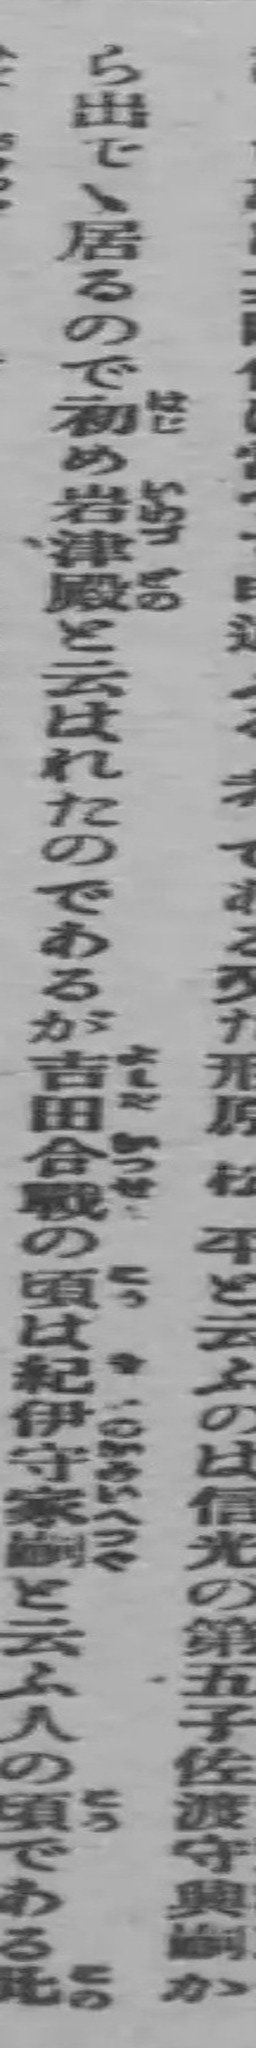ら出でゝ居るので初め岩津殿と云はれたのであるが吉田合戦の頃は紀伊守家嗣と云ふ人の頃である此
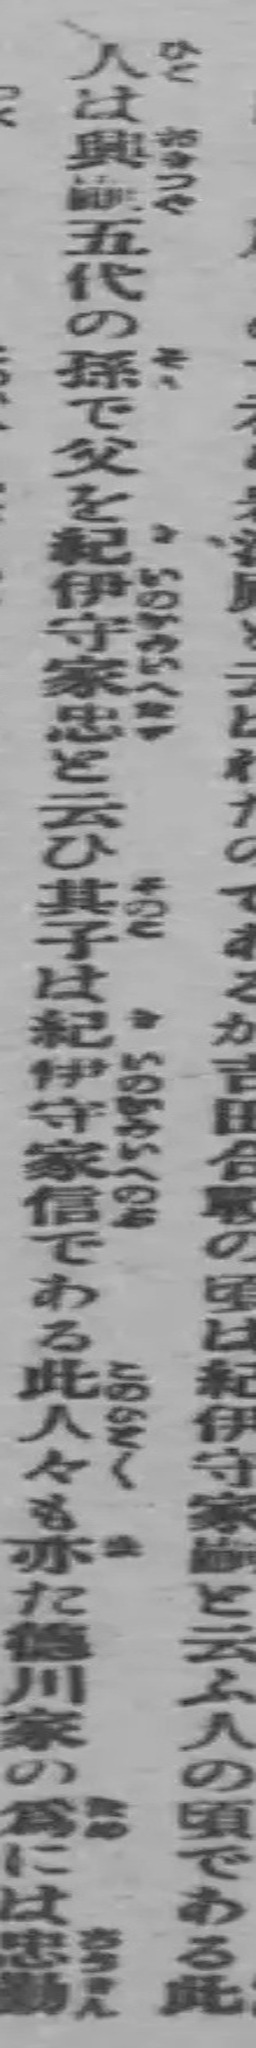人は興嗣五代の孫で父を紀伊守家忠と云ひ其子は紀伊守家信である此人々も亦た徳川家の為には忠勤
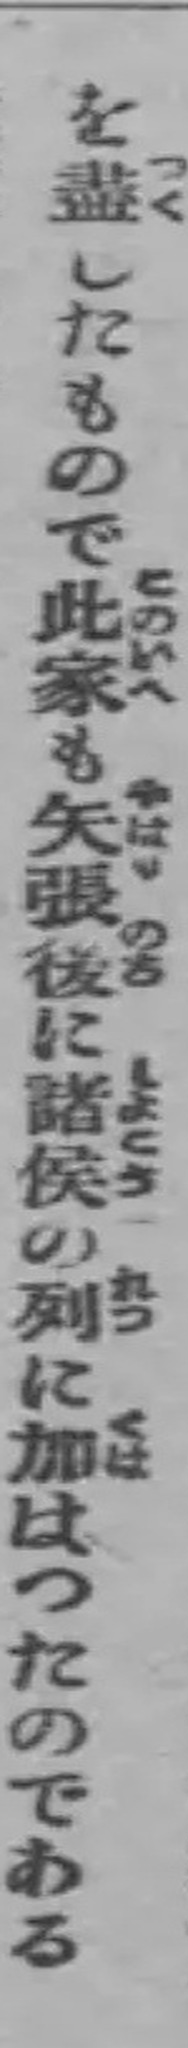を尽したもので此家も矢張後に諸侯の列に加はつたのである
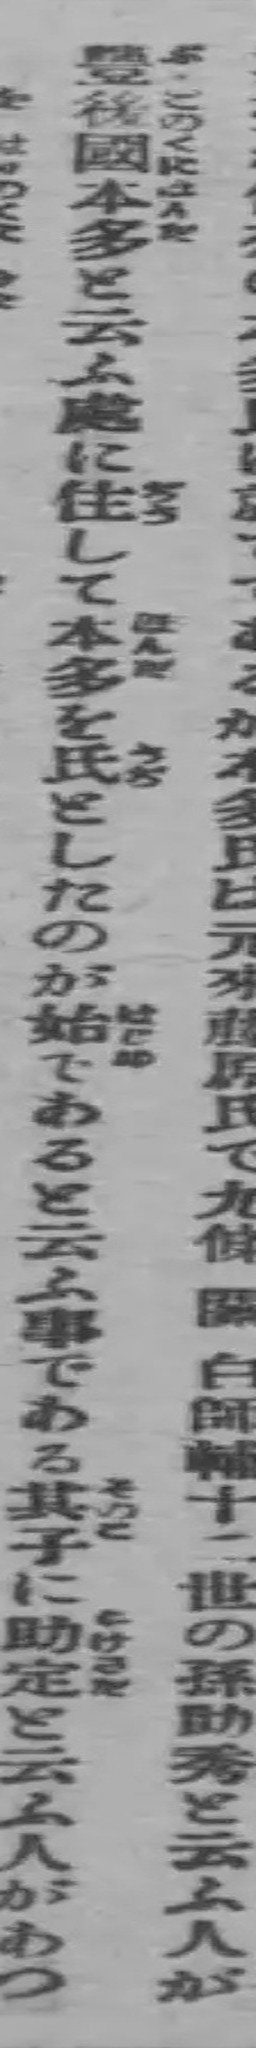豊後国本多と云ふ処に住して本多を氏としたのが始であると云ふ事である其子に助定と云ふ人があつ
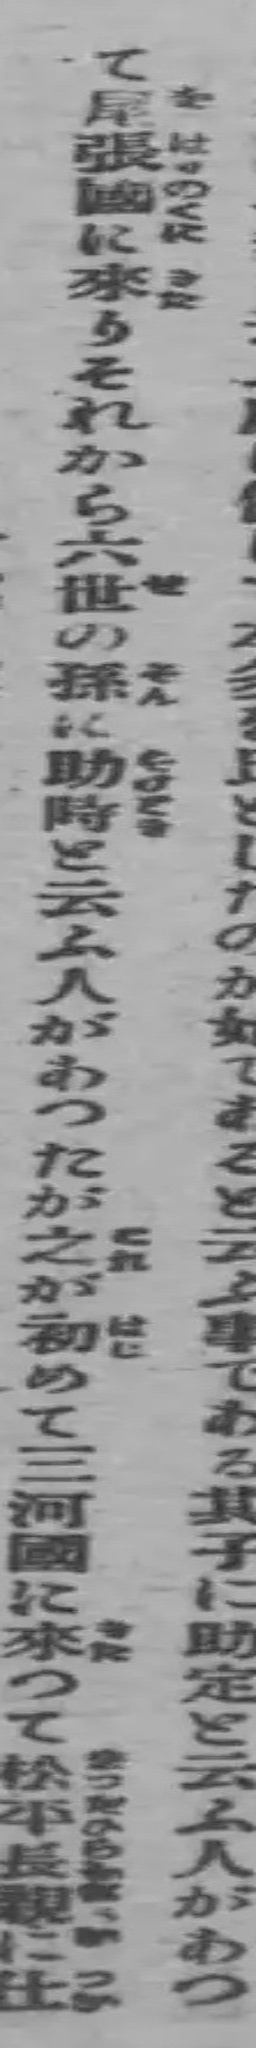て尾張国に来りそれから六世の孫に助時と云ふひと人があつたが之が初めて三河国に来つて松平長親に仕
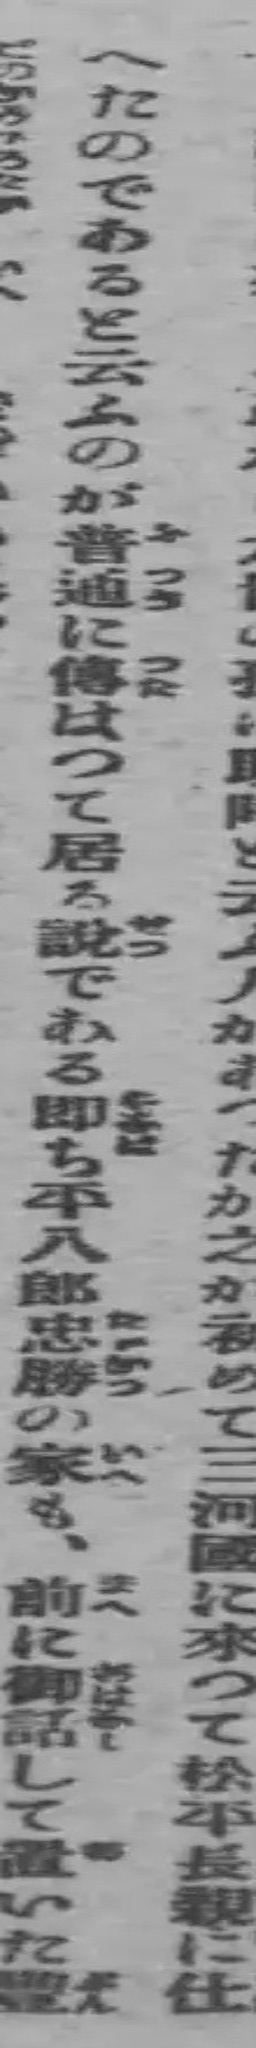へたのであると云ふのが普通に伝はつて居る説である即ち平八郎忠勝の家も、前に御話して置いた豊
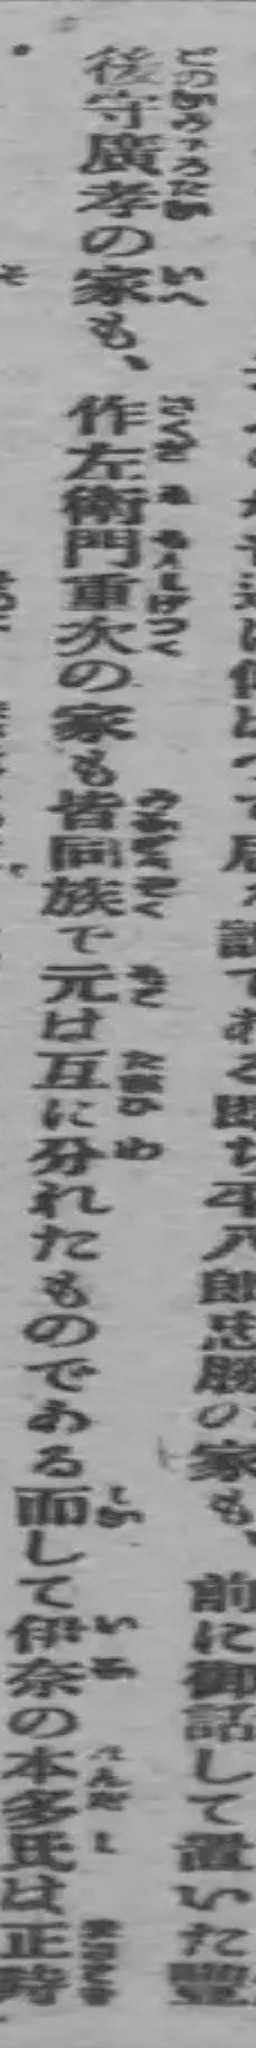後守広孝の家も、作左衛門重次の家も皆同族で元は互に分れたものである而して伊奈の本多氏は正時
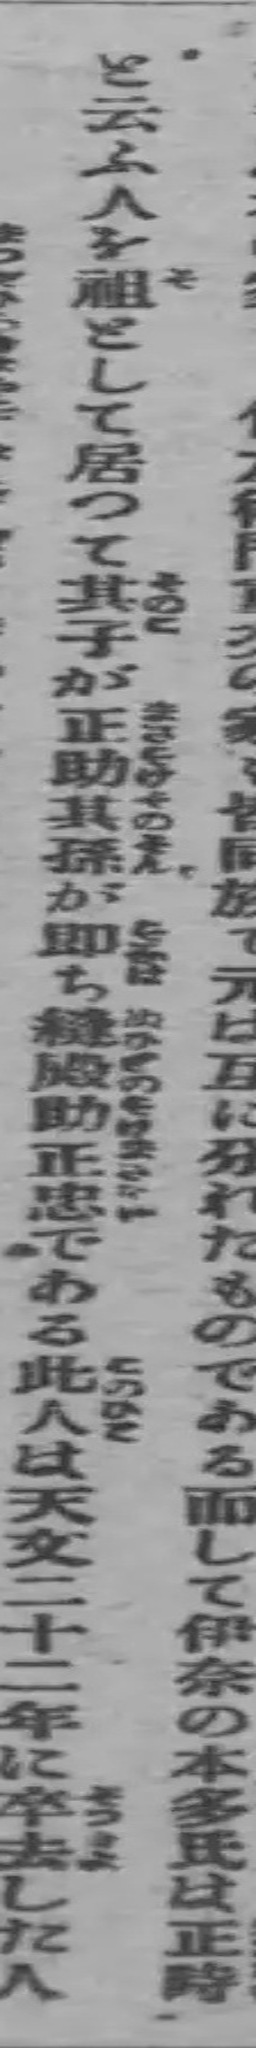と云ふ人を祖として居つて其子が正助其孫が即ち縫殿助正忠である此人は天文二十二年に卒去した人
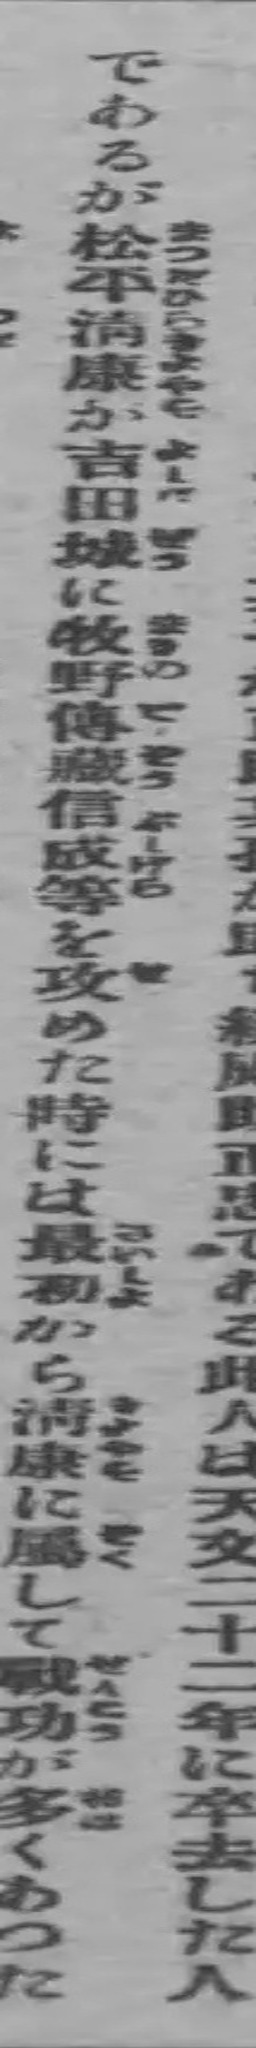であるが松平清康が吉田城に牧野傳蔵信成等を攻めた時には最初から清康に属して戦功が多くあつた
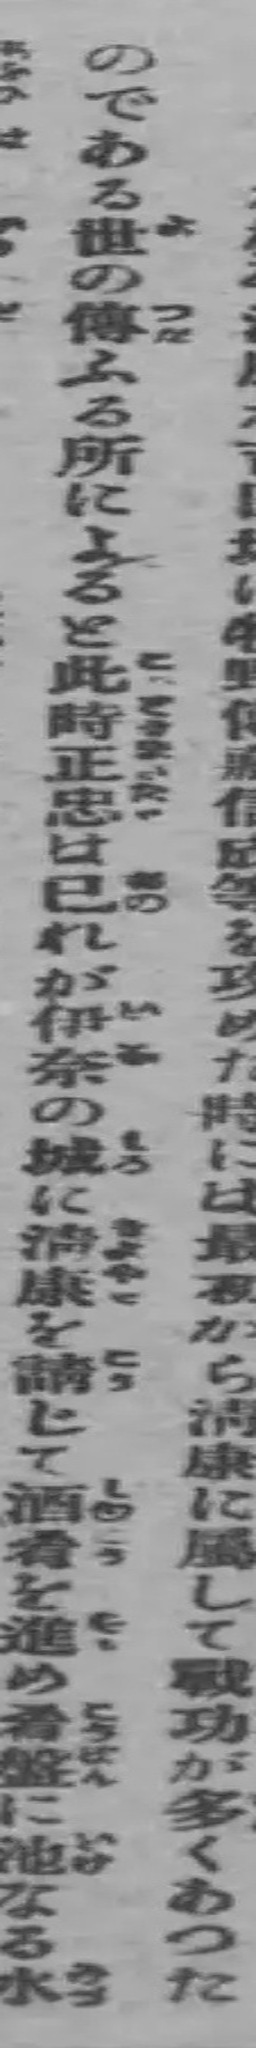葵紋の説のである世の伝ふる所によると此時正忠は巳れが伊奈の城に清康を請じて酒肴を進め肴盤に池なる水
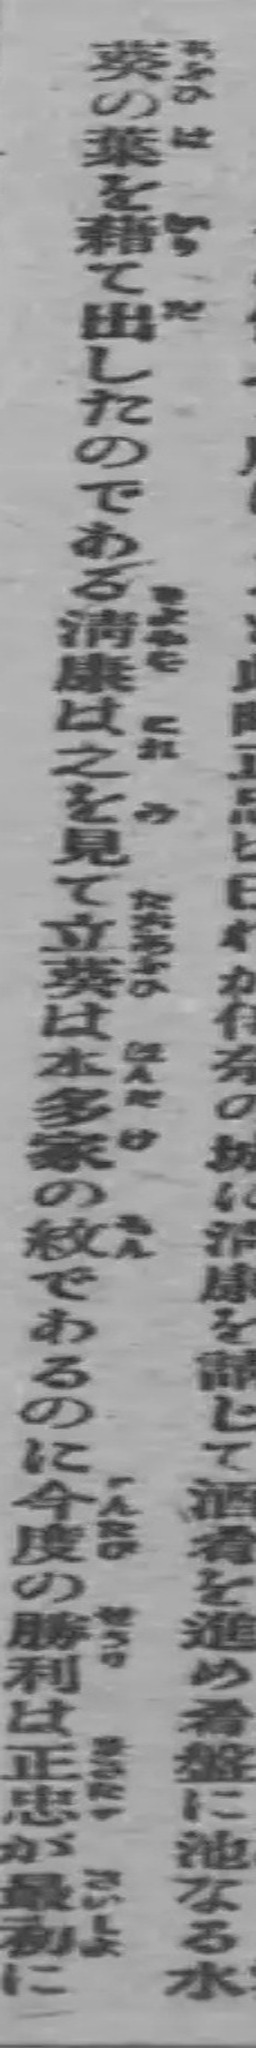葵の葉を藉て出したのである清康は之を見て立葵は本多家の紋であるのに今度の勝利は正忠が最初に
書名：豊橋市史談
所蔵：国立国会図書館 National Diet Library, JAPAN
